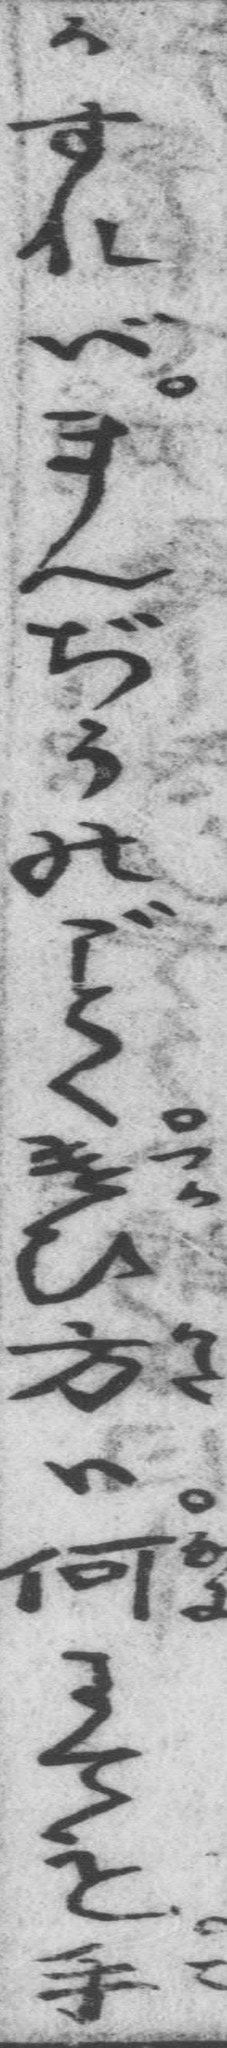かすれば。まんぢうのごとく。遣ひ方は。何にても。手
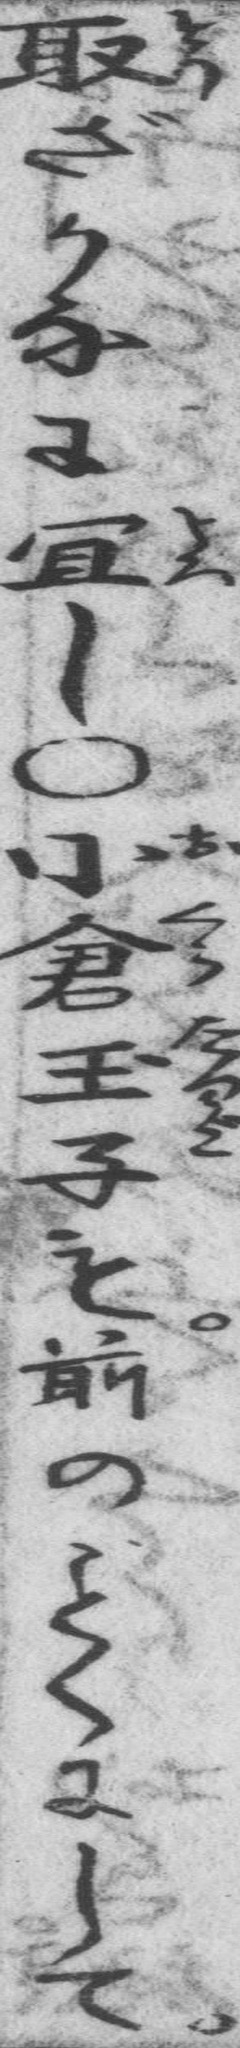取ざかなに宜し○小倉玉子も。前のことくにして。
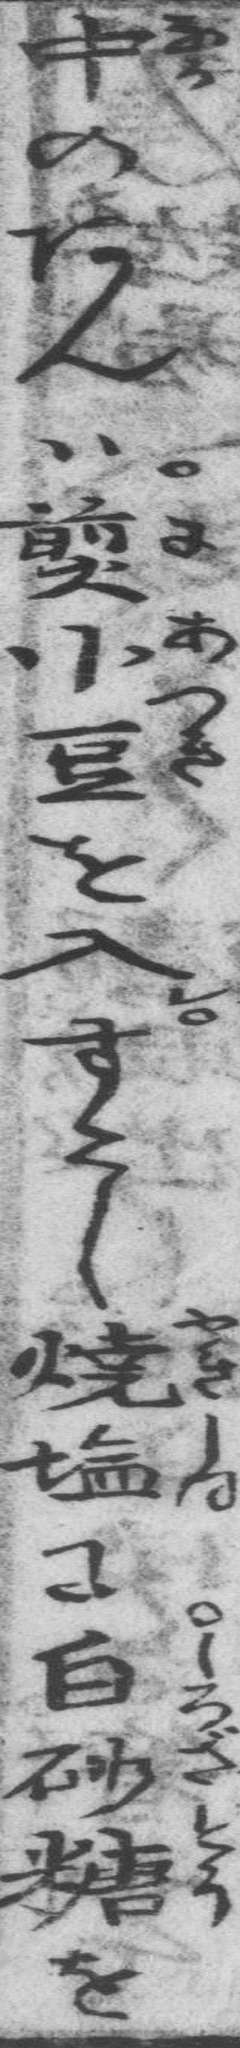中のあんは。煎小豆を入れ。すこし焼塩に。白砂糖を
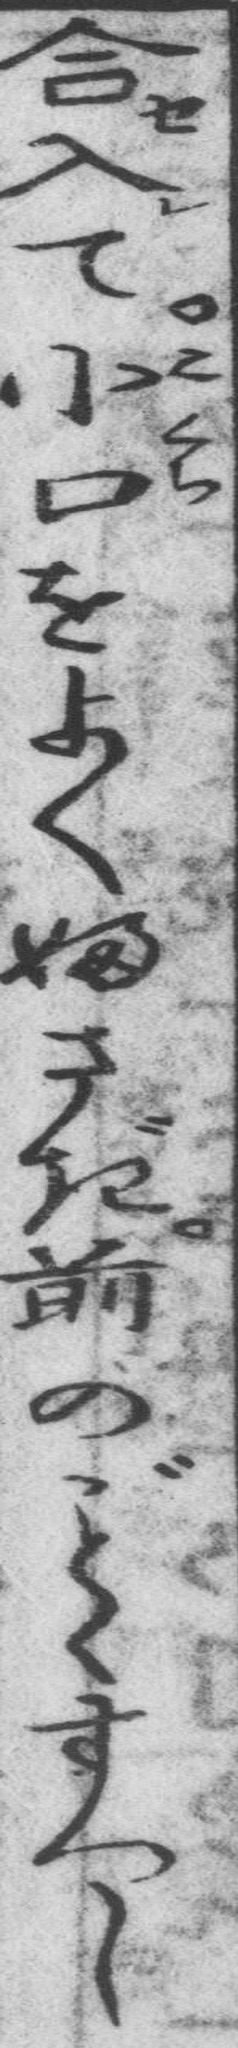合せ入れて。小口をよくふさぎ、前のごとくすへし
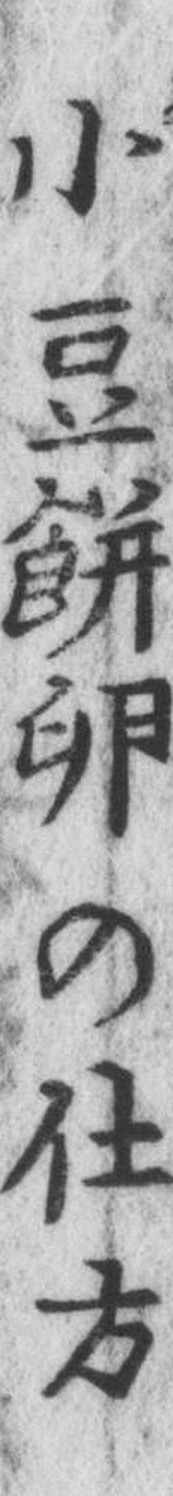小豆餅卵の仕方
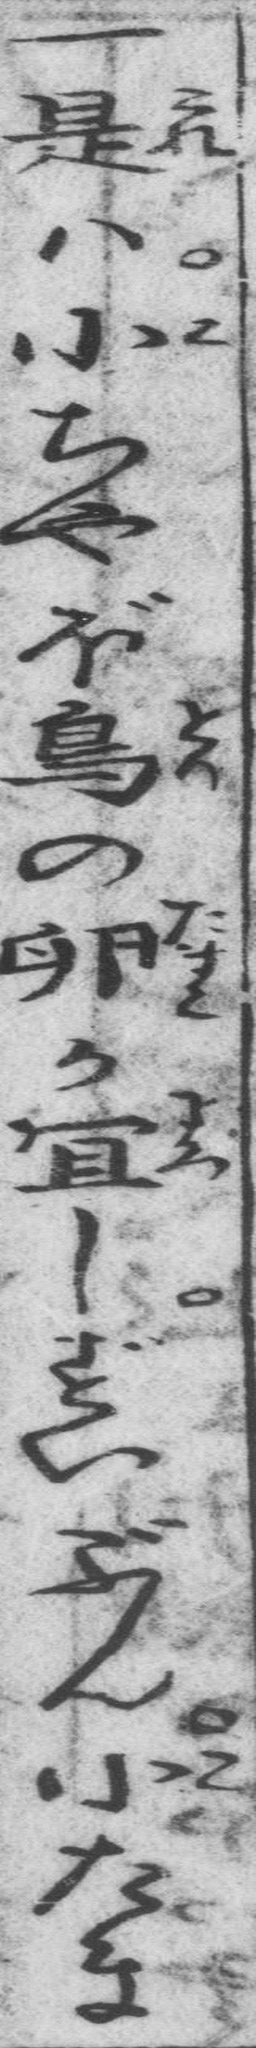一是は。小ちやぼ鳥の卵か宜し。ずいぶん。小たま
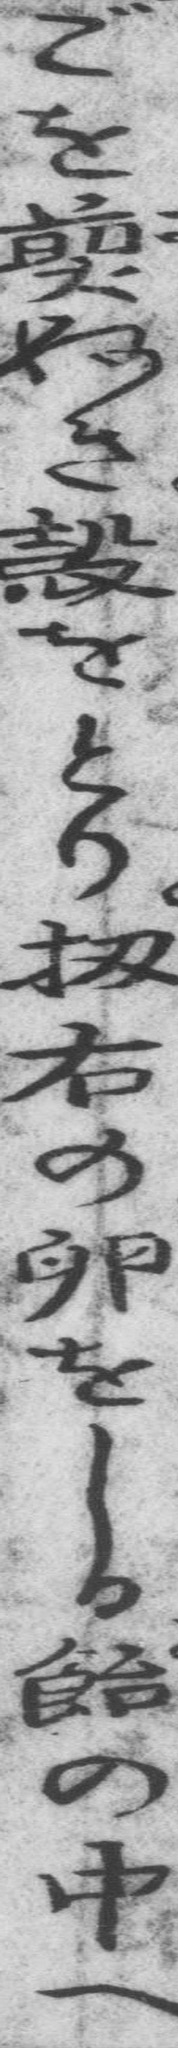ごを煎ぬき。殻をとり。扨右の卵を。しる飴の中へ
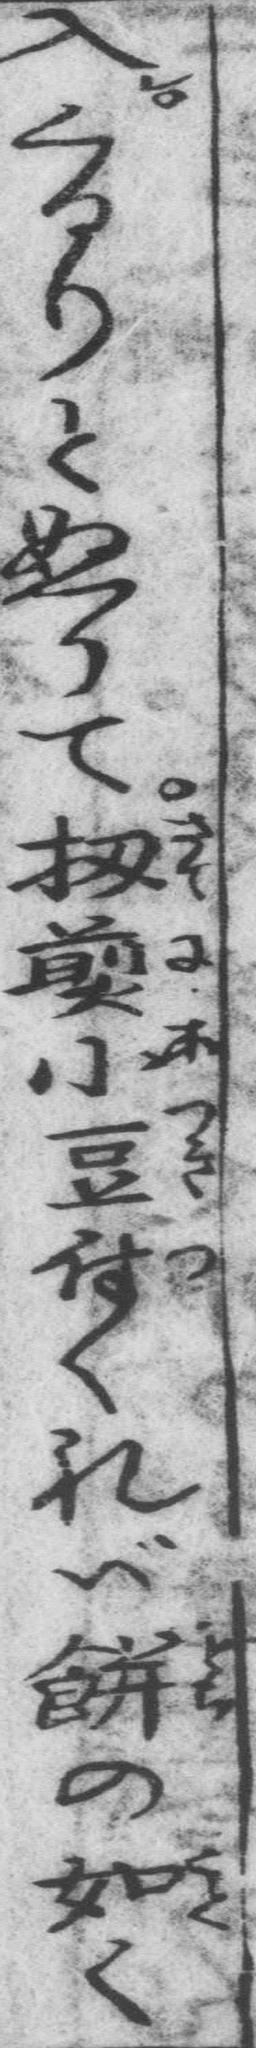入れ。くるりとぬりて。扨煎小豆付くれば餅の如く
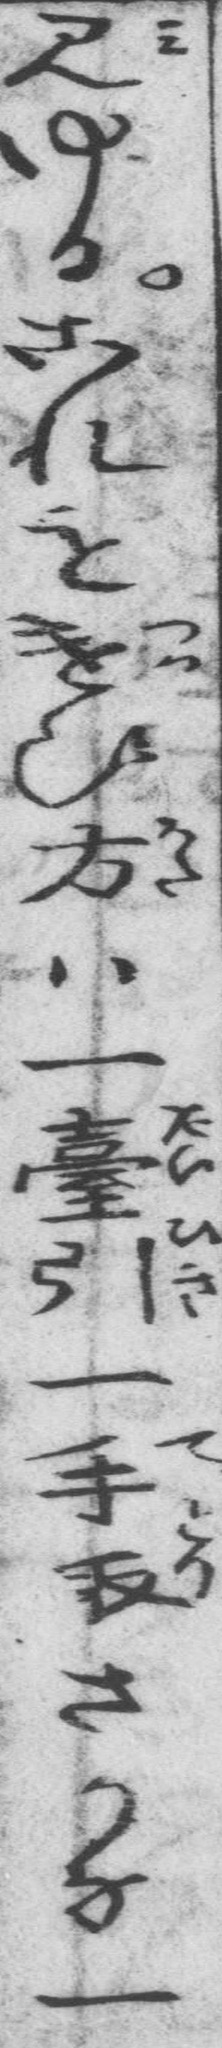見ゆる。これも遣ひ方は一台引一手取さかな一
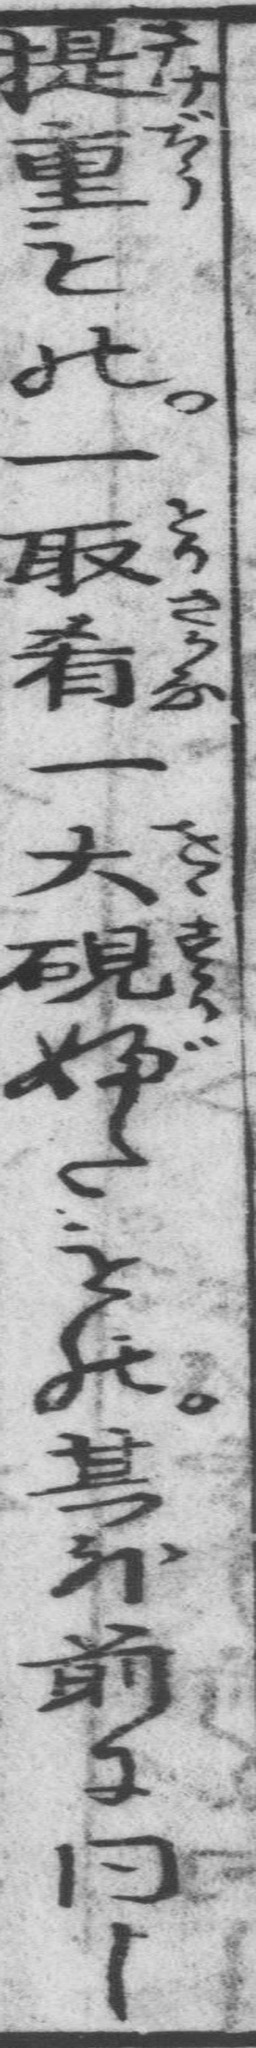提重もの。一取肴一大硯ぶたもの。其外前に同し
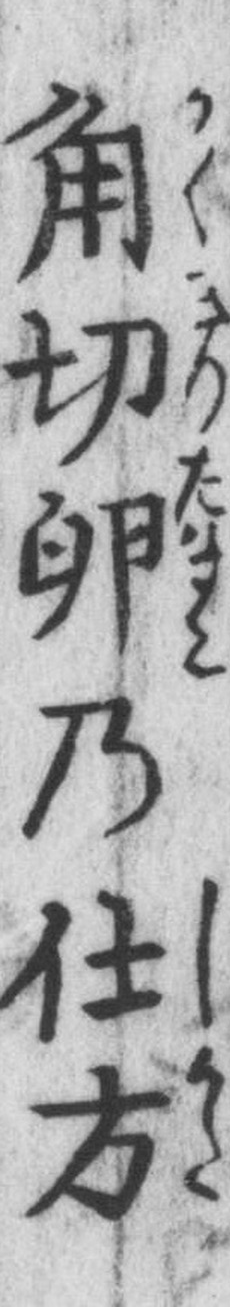角切卵の仕方
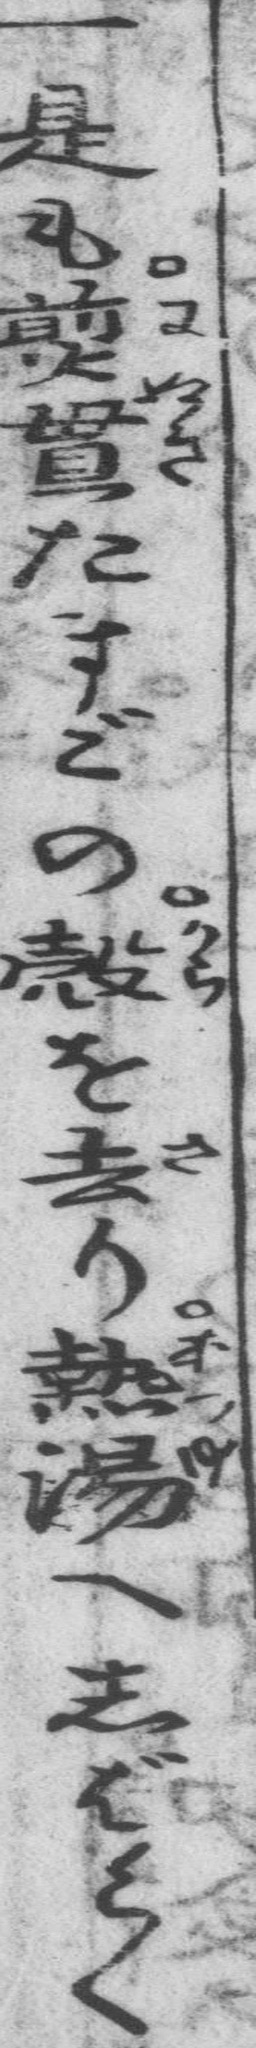一是も。煎貫たまごの。殻を去り。熱湯へしばらく

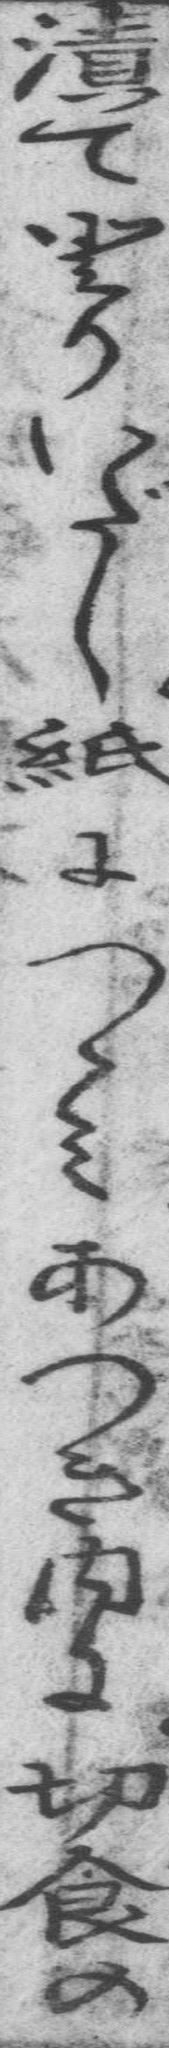漬てとりいだし。紙につゝみ。あつき内に。切食の。
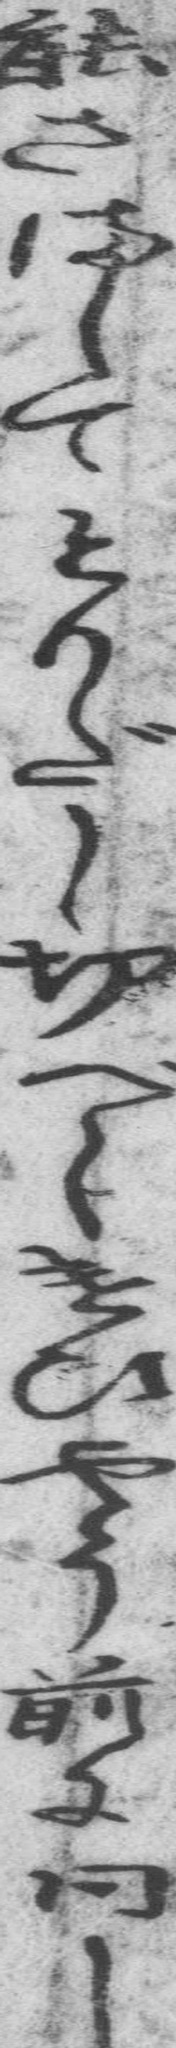能さましてとりだし。切べし。遣ひやう前に同し
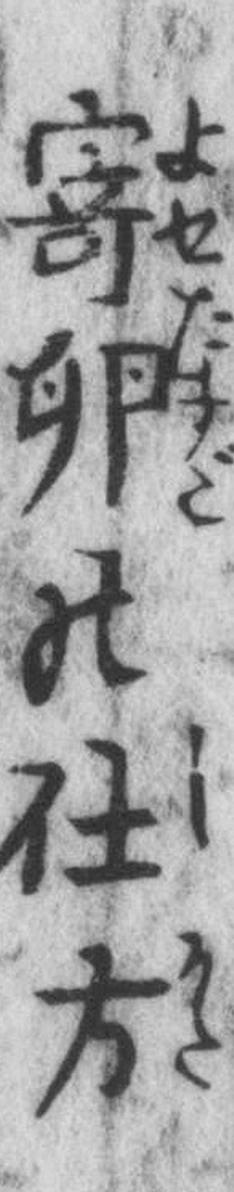寄卵の仕方
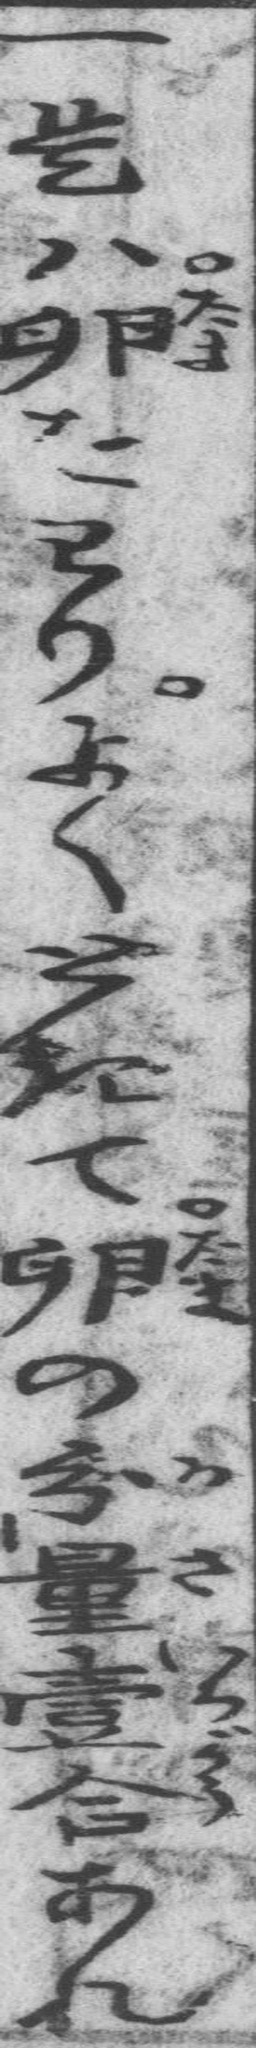一是は。卵をわり。よくときて。卵の分量壱合あれ
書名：萬寳料理秘密箱
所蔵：大阪府立大学学術情報センター 国文学研究資料館
